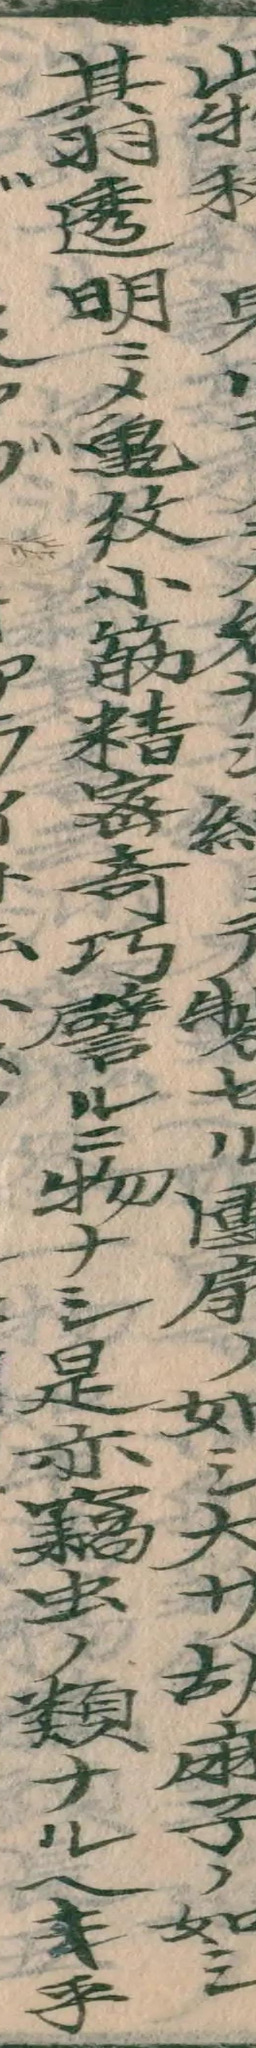其羽透明ニシテ亀紋小筋精密奇巧譬ルニ物ナシ是亦𥨸虫ノ類ナルヘキ乎

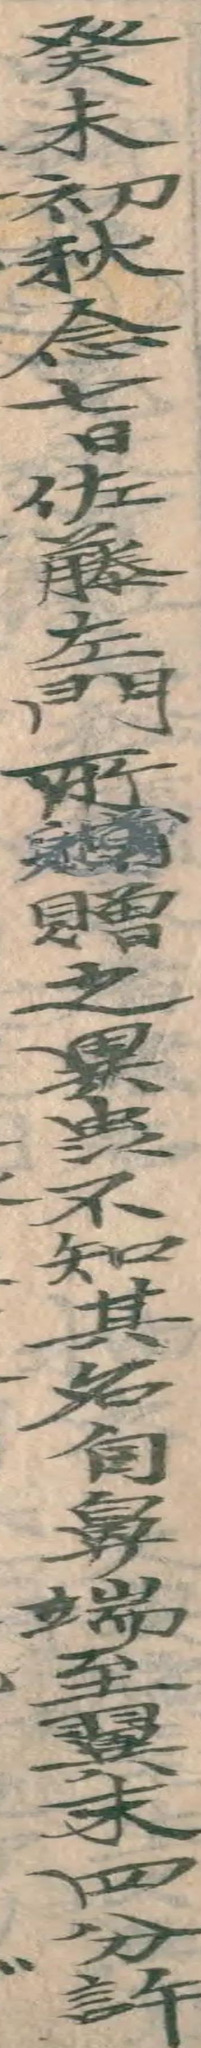癸未初秋念七日佐藤左門所贈之異蟲不知其名自鼻端至翼末四分許
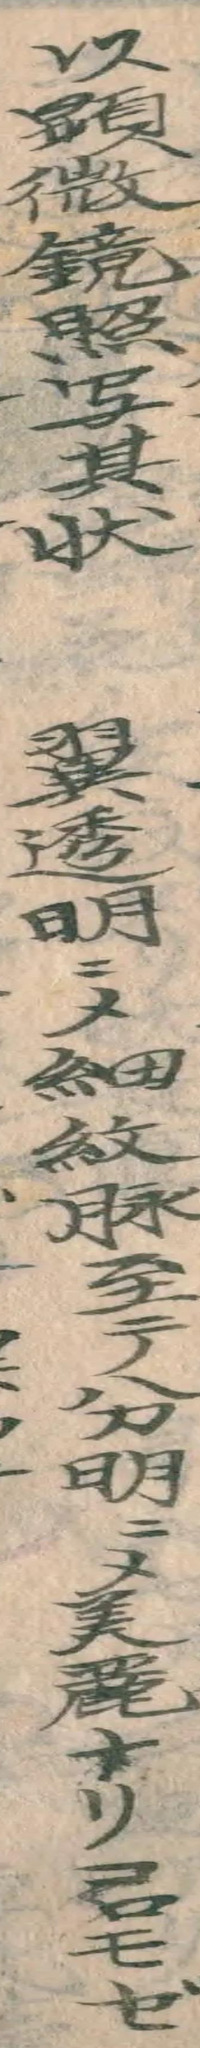以顕微鏡照写其状翼透明ニシテ細紋脉至テ分明ニシテ美麗ナリコロモゼ
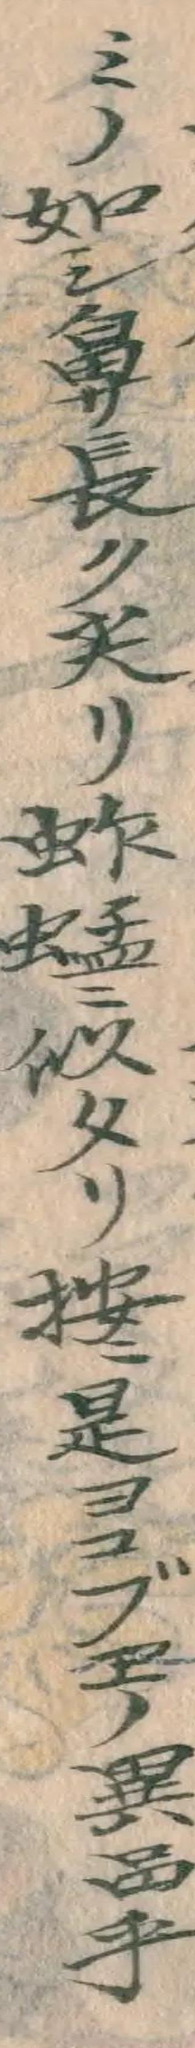ミノ如シ鼻長ク尖リ蚱蜢ニ似タリ按ニ是ヨコブヱノ異品乎
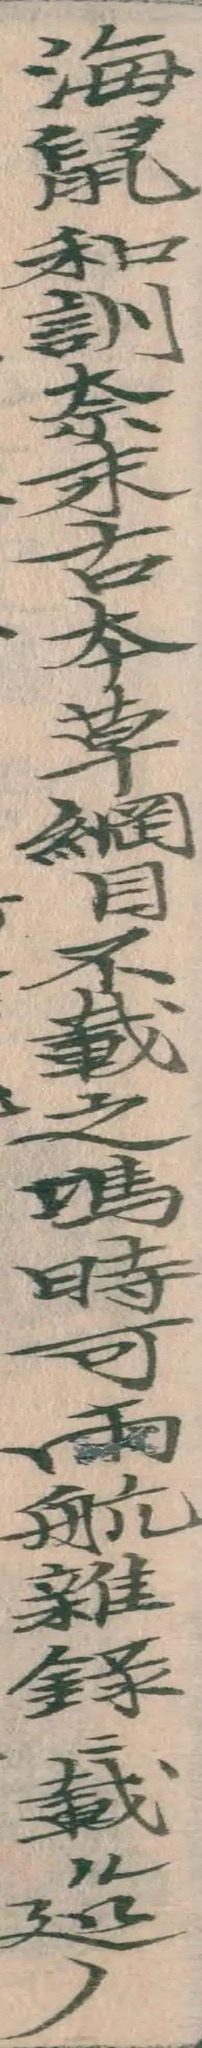海鼠和訓奈末古本草綱目不載之馮時可雨航雑録ニ載ル処ノ
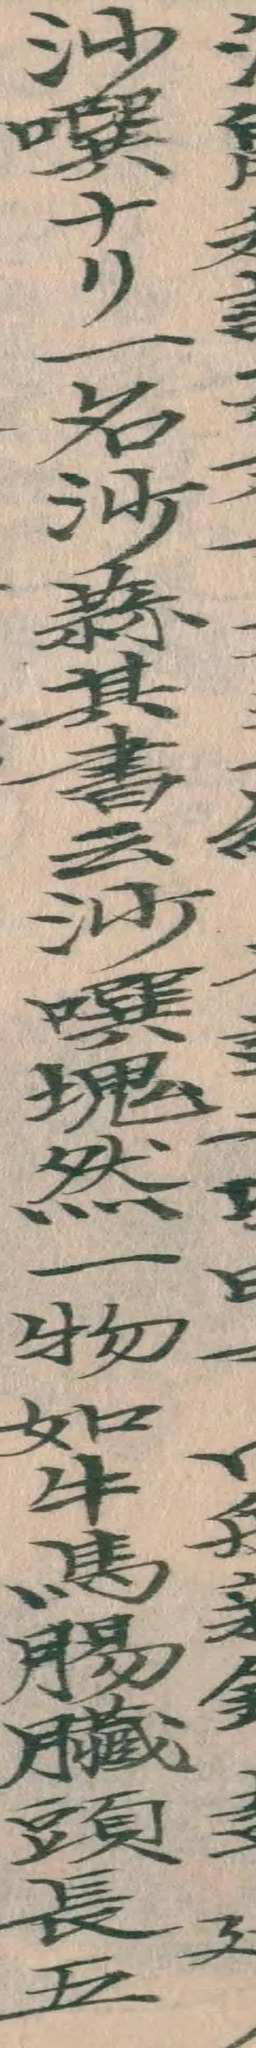沙噀ナリ一名沙蒜其書云沙噀塊然一物如牛馬腸臓頭長五
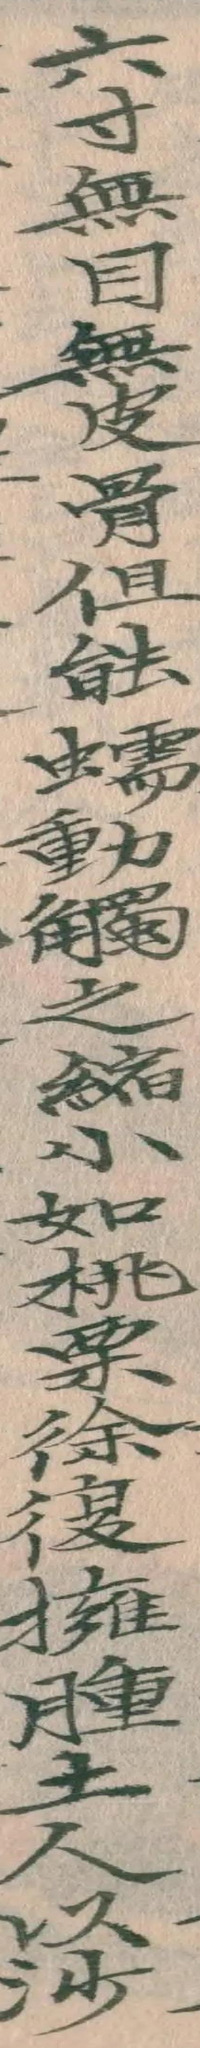六寸無目無皮骨伹能蠕動觸之縮小如桃栗徐復擁腫土人以沙
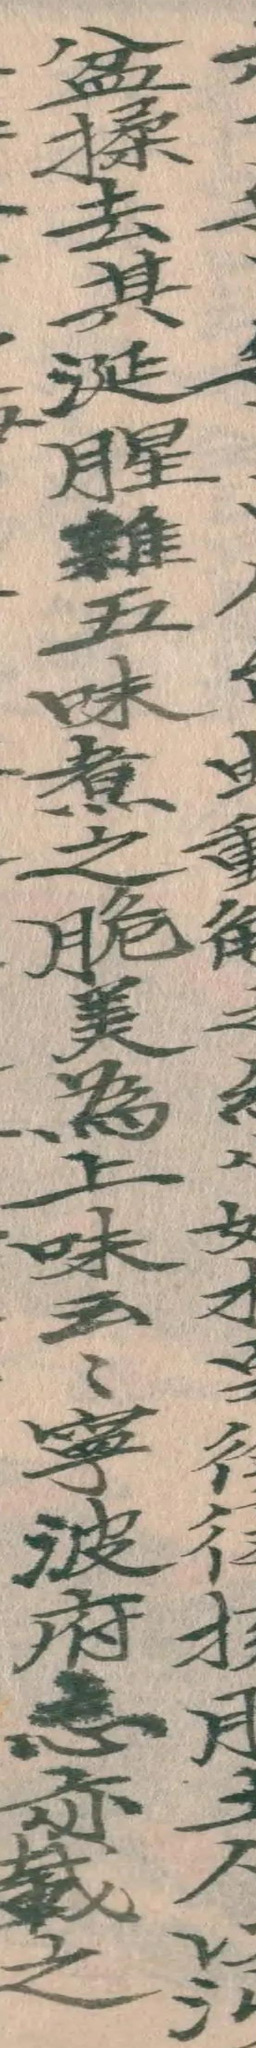盆揉去其涎腥雑五味煮之脆美為上味云々寧波府志亦載之
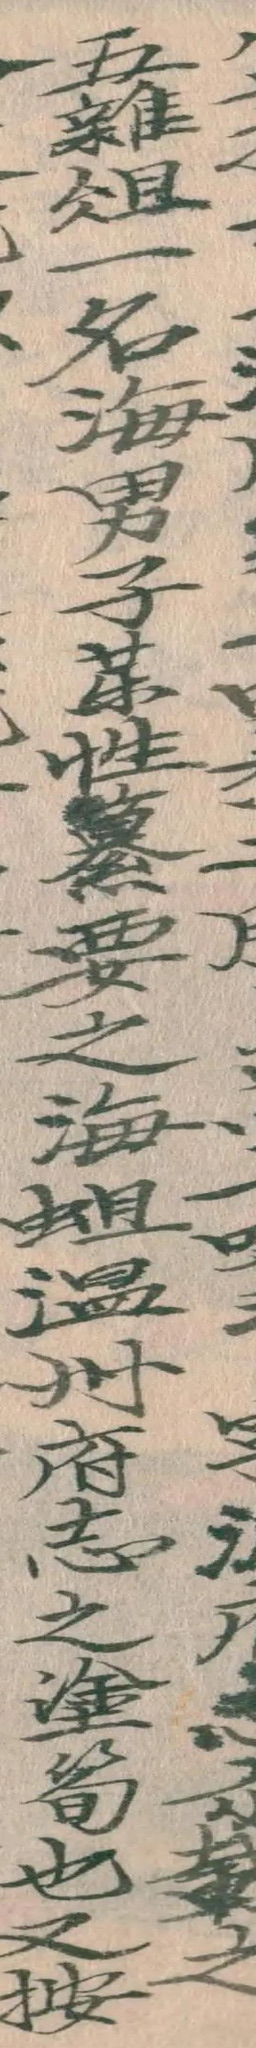五雑俎一名海男子薬性纂要之海蛆温州府志之塗筍也又按
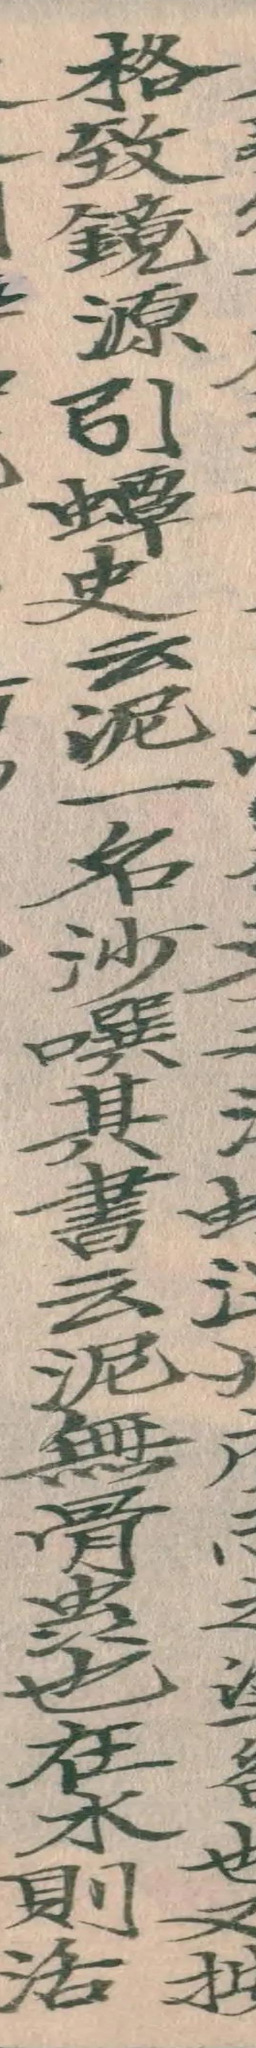格致鏡源引蟫史云泥一名沙噀其書云泥無骨蟲也在水則活
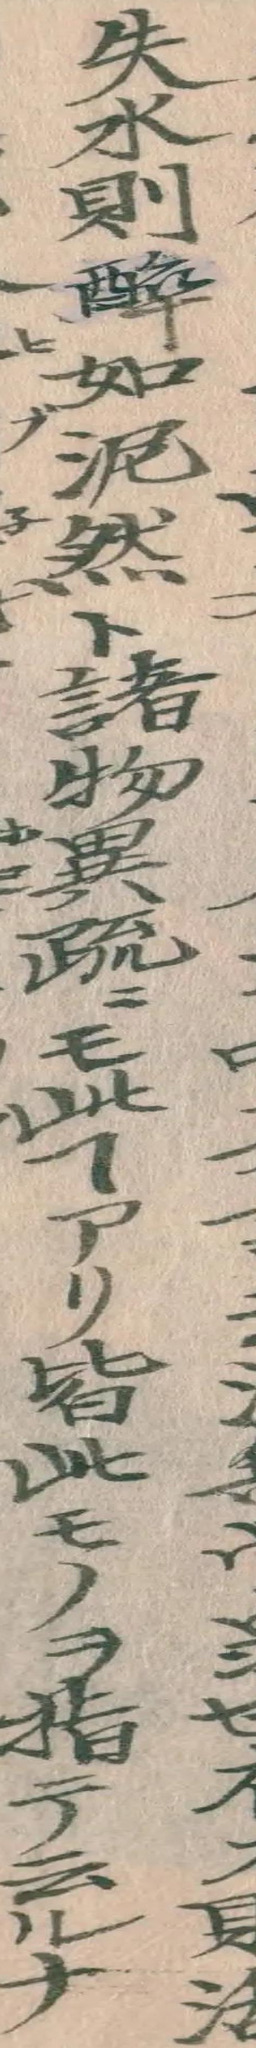失水則醉如泥然ト諸物異疏ニモ此コトアリ皆此モノヲ指テ云ルナ
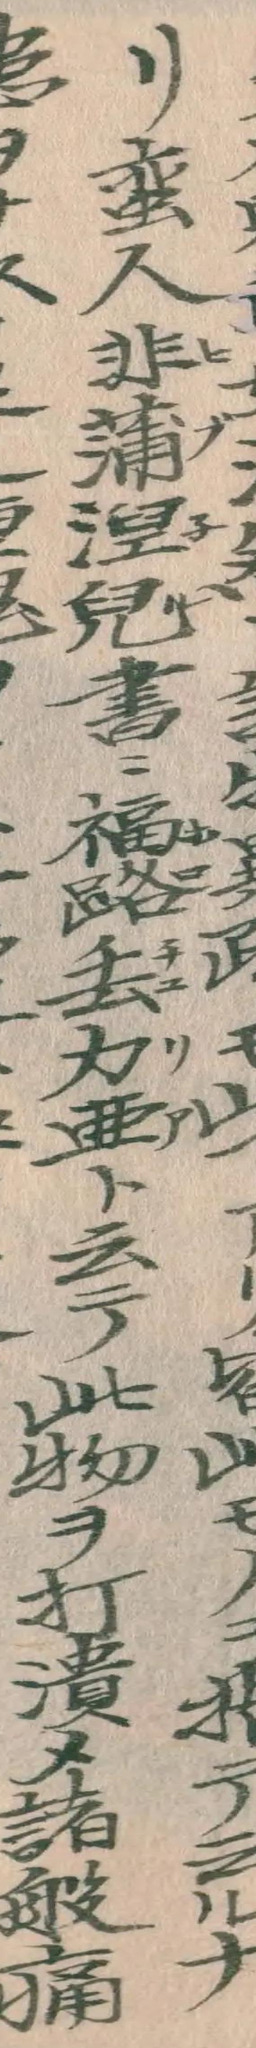リ蛮人非蒲湼兒書ニ福路丢力亜ト云テ此物ヲ打潰シテ諸般痛
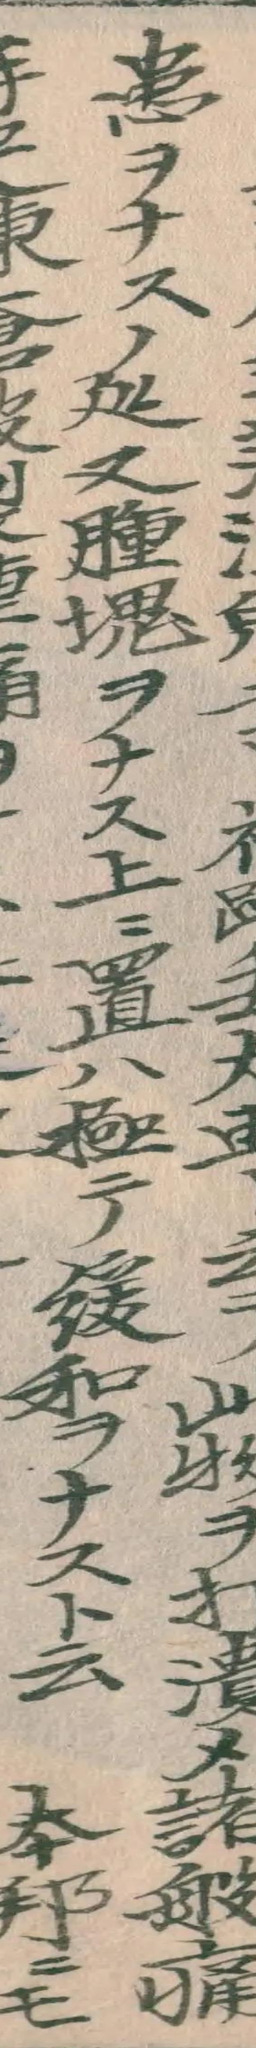患ヲナスノ処又腫塊ヲナス上ニ置ハ極テ緩和ヲナスト云本邦ニモ
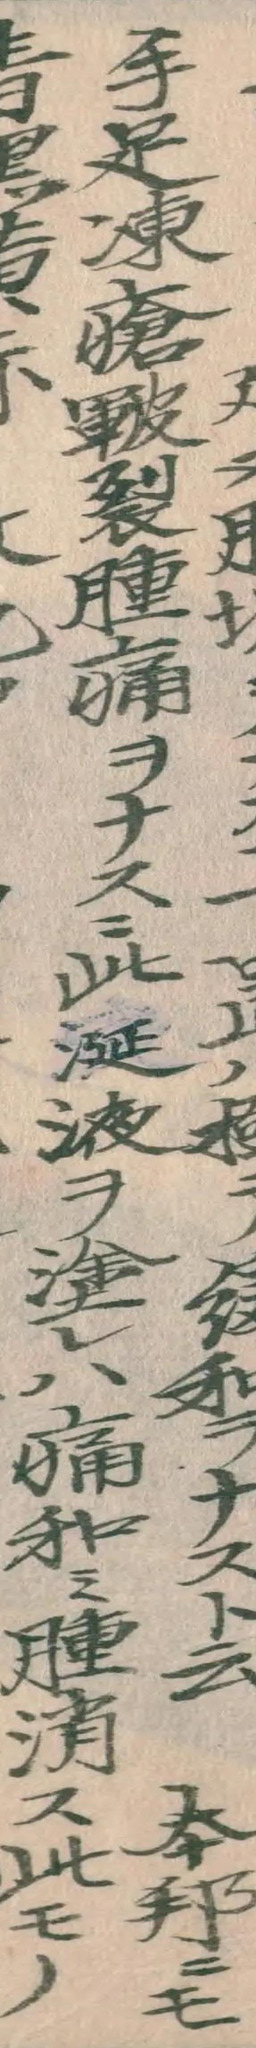手足凍瘡皸裂腫痛ヲナスニ此涎液ヲ塗レハ痛和ミ腫消ス此モノ
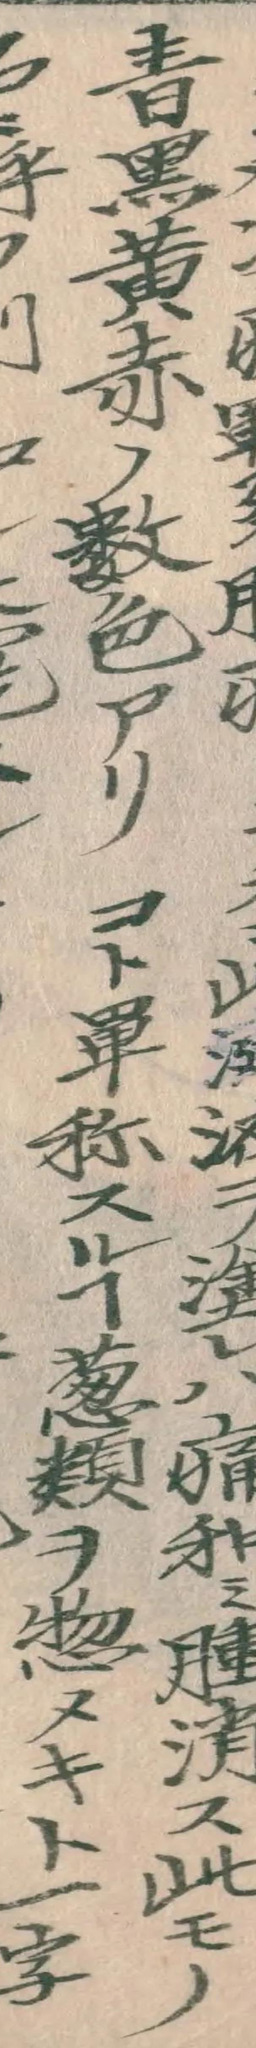青黒黄赤ノ数色アリコト単称スルコト葱類ヲ惣シテキト一字
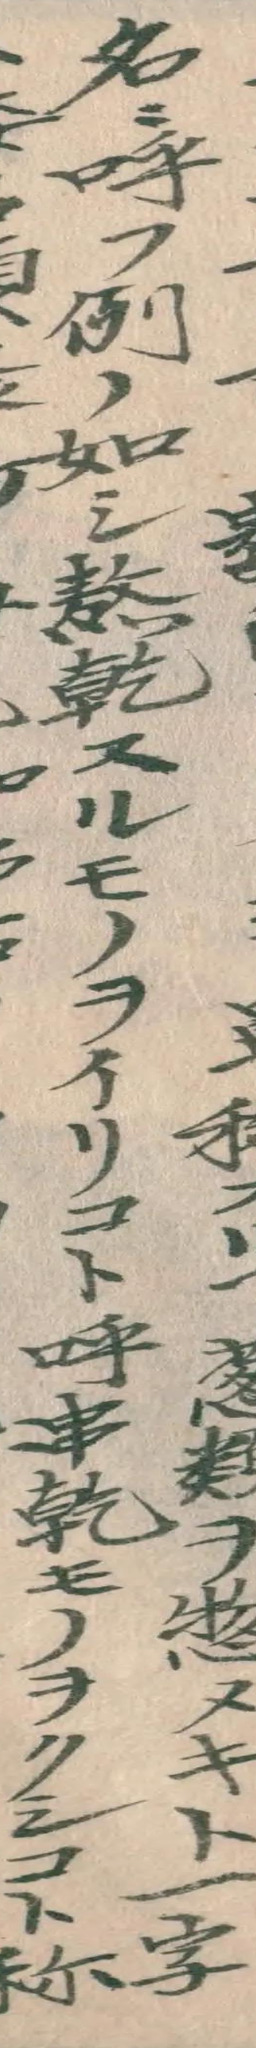名ニ呼フ例ノ如シ熬乾スルモノヲイリコト呼串乾モノヲクシコト称
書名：千蟲譜 3巻. [3]
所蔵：国立国会図書館 National Diet Library, JAPAN
